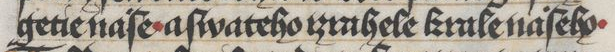getie naẛe.a ſwateho izrahele krale naẛeho.
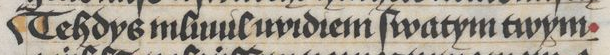Tehdys mluuil uvidieni ſwatym twym.
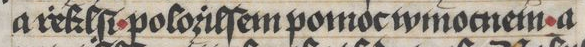a ṙeklſi.polożilſem pomoc wmocnem.a
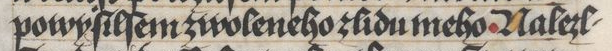powyẛilſem zwoleneho zlidu meho.Nalezl
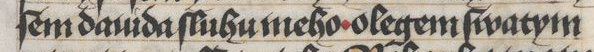ſem dauida ſluhu meho.olegem ſwatym
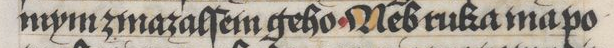mym zmazalſem geho.Neb ruka ma po¬
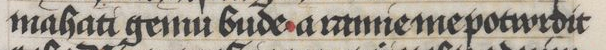mahati gemu bude.a ramie me potwrdit
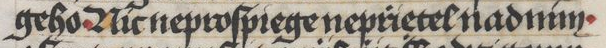geho.Nic neproſpiege nepṙietel nadním.
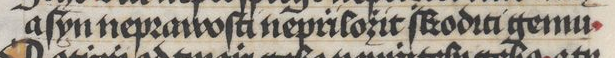a ſyn neprawoſti nepṙilożit ẛkoditi gemu.
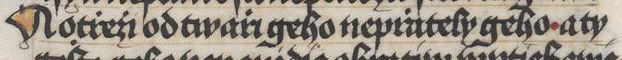A otṙeżi od twaṙi geho nepṙately geho.a ty
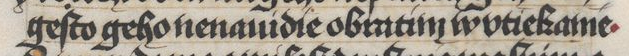geẛto geho nenauidie obrcatim wvtiekanie.
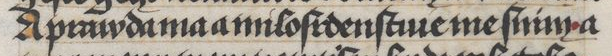A prawda ma a miloſrdenſtuie me ſnim.a
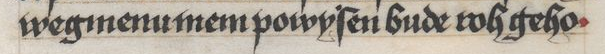wegmenu mem powyẛen bude roh geho.
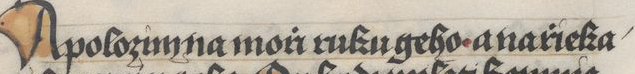Apolozim na moṙi ruku geho.a naṙieka¬
